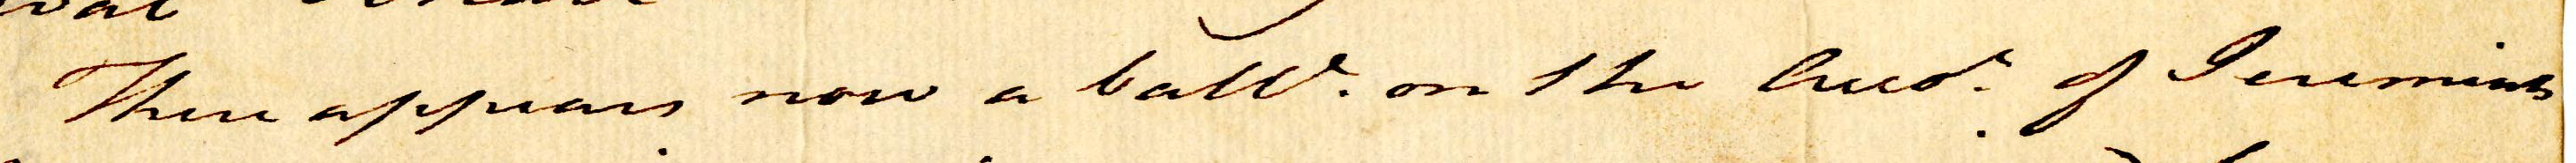There appears now a ball^e. on the Acco^t. of Jeremiah
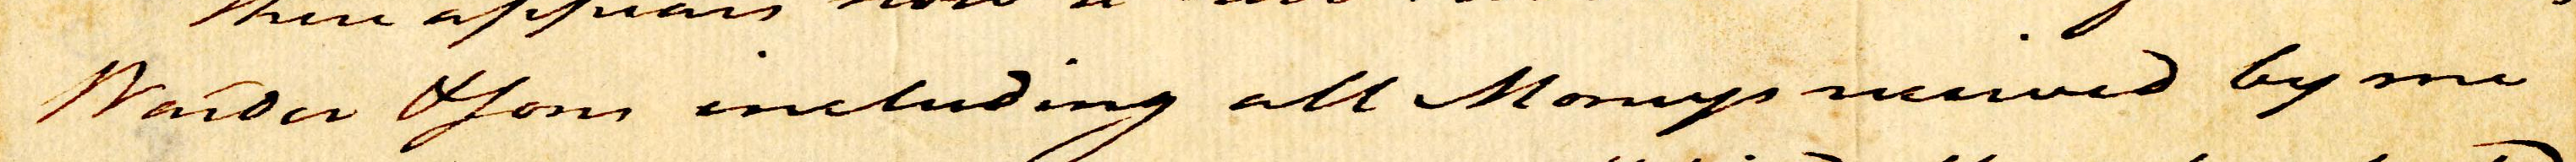Warder & Yours including all Moneys received by me
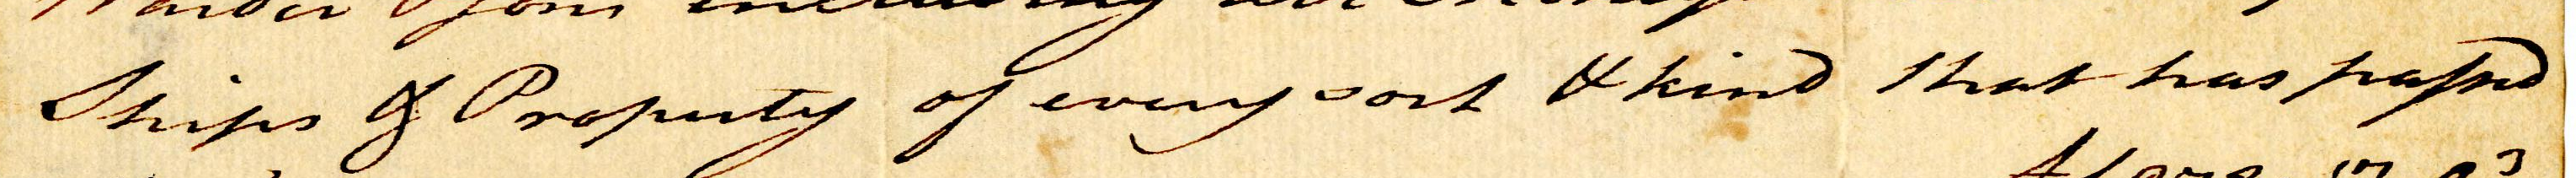Ships & Property of every sort & kind that has passed
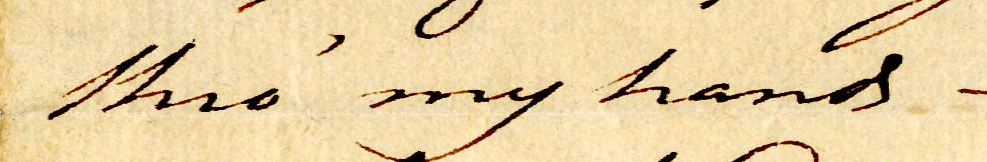thro' my hands
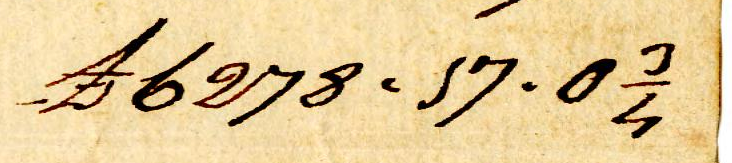£6278.17.0 3/4
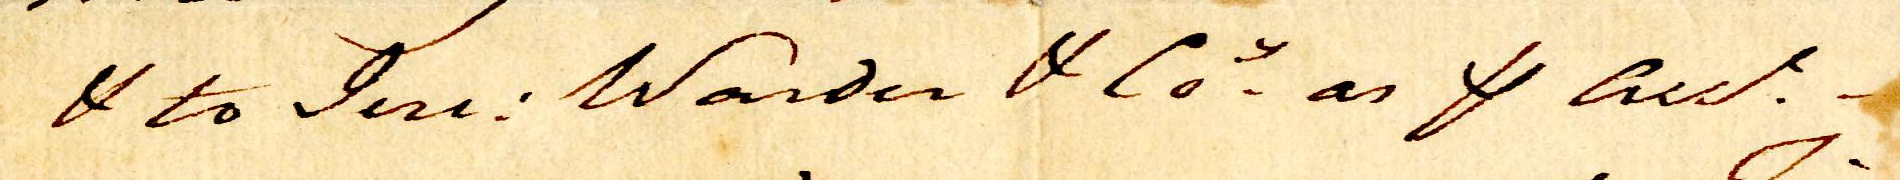& to Jere: Warder & Co^y. as per Acc^t.
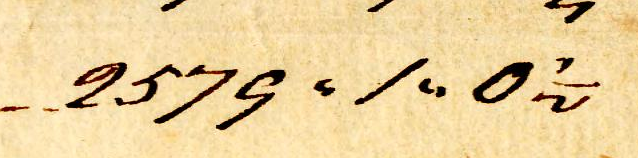2579.1.0 1/2
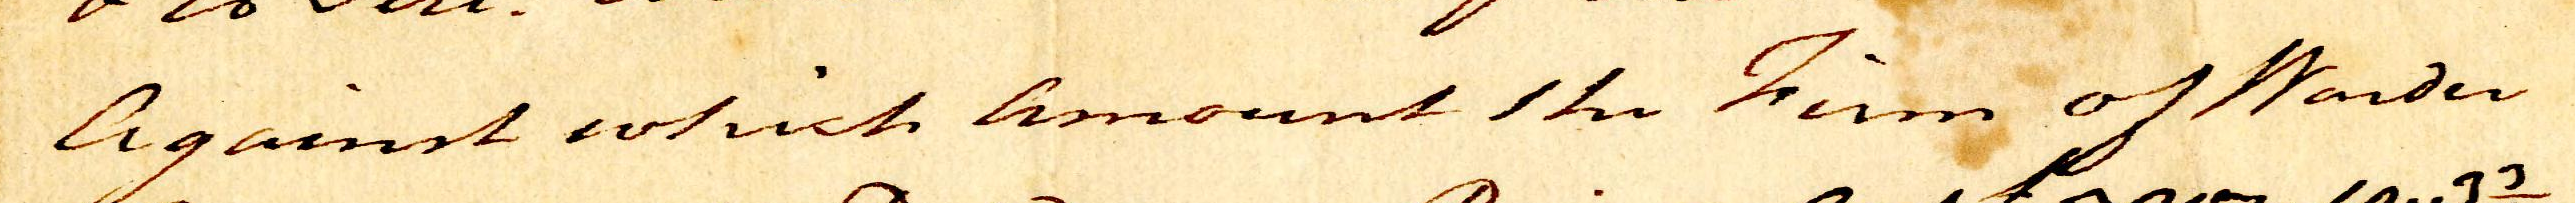Against which Amount the Firm of Warder
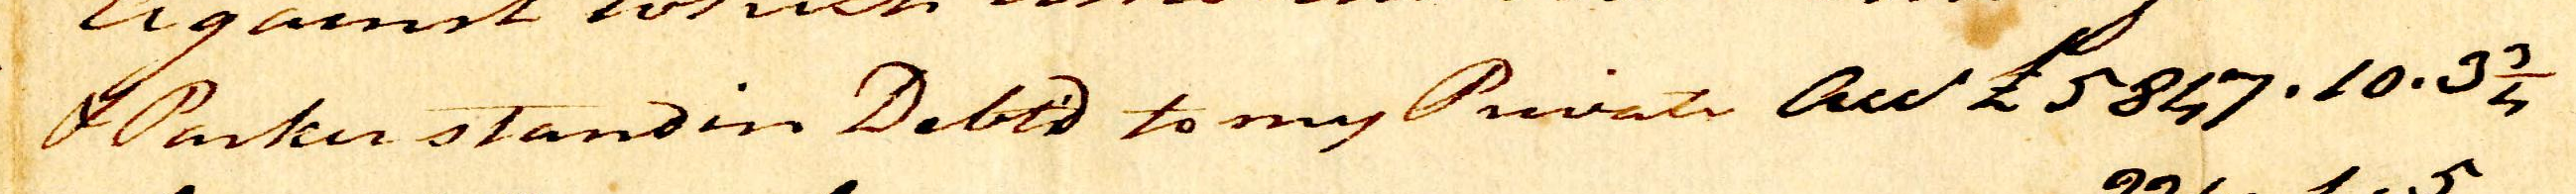& Parker stand in Debt'd to my Private Acc^t £5847.10.3 3/4
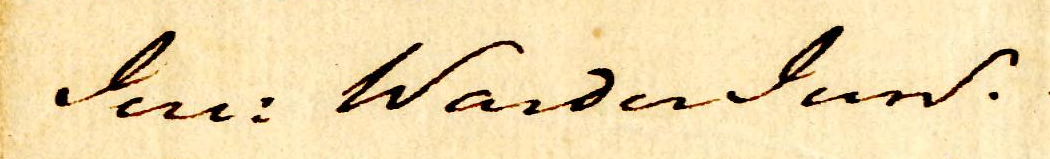Jere: Warder Jun^r.
